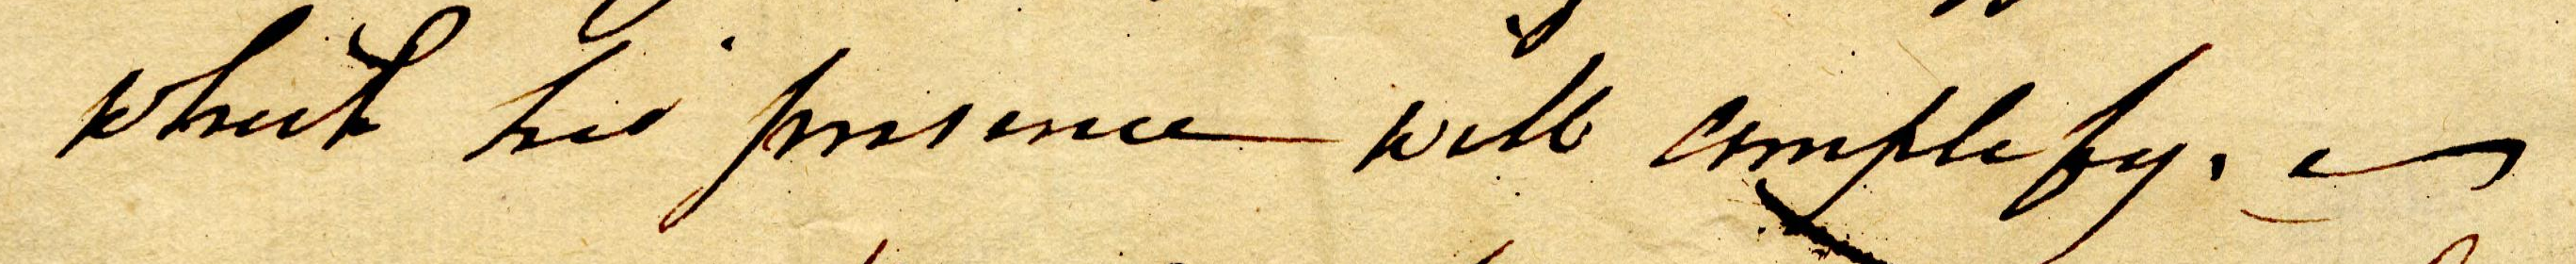what his presence will complefy.-
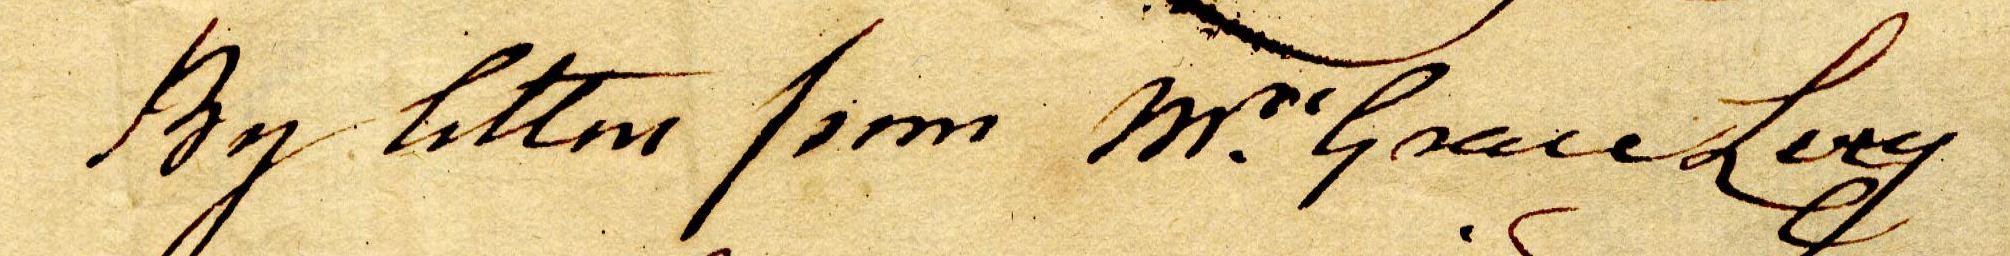By letters from M^rs. Grace Levy
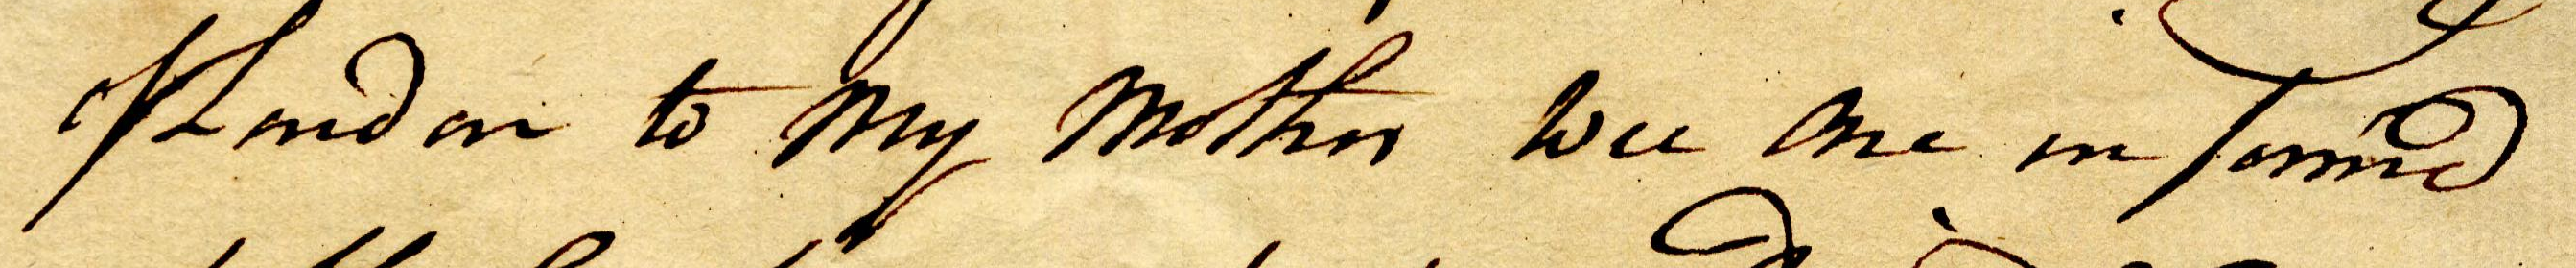of London to My Mother wee are inform'd
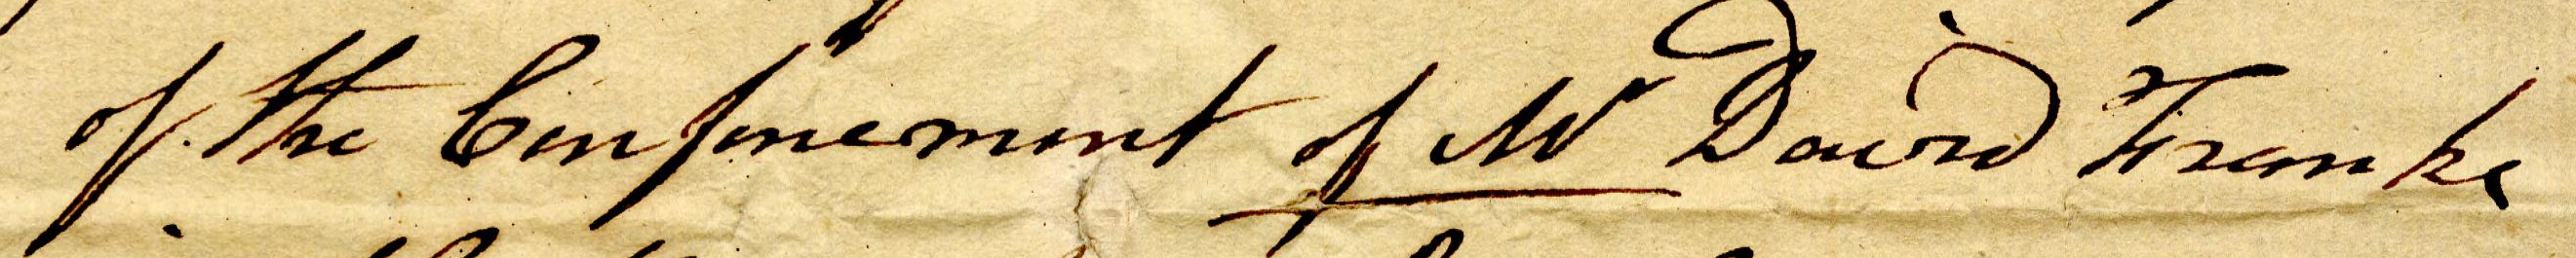of the Confinement of M^r David Franks
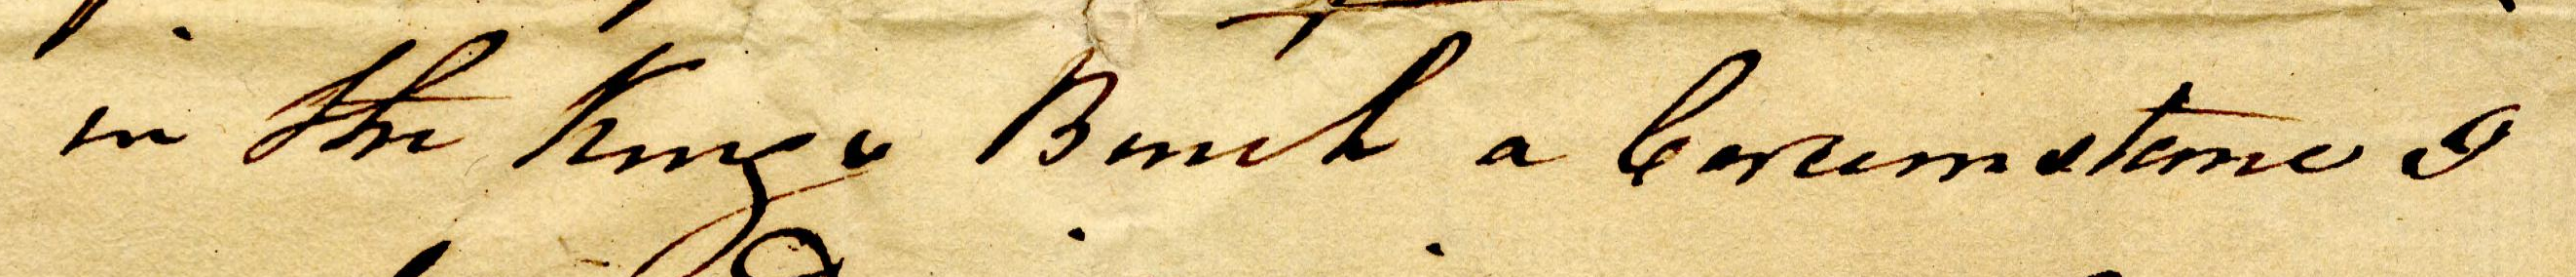in the Kings Brick a Circumstance I
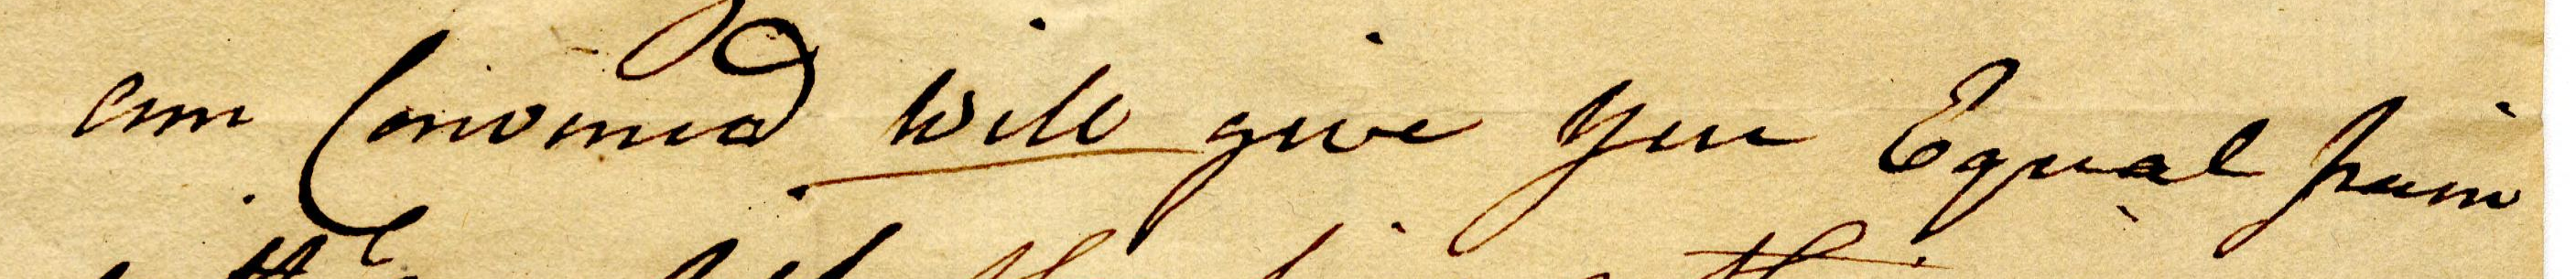am Convinced will give you Equal pain
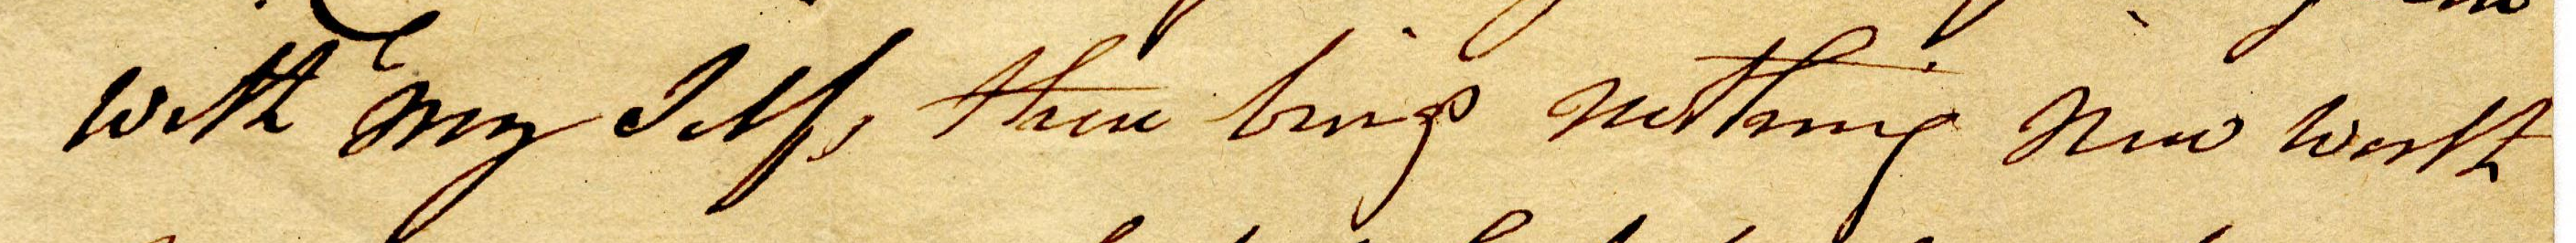with my self, there being nothing now worth
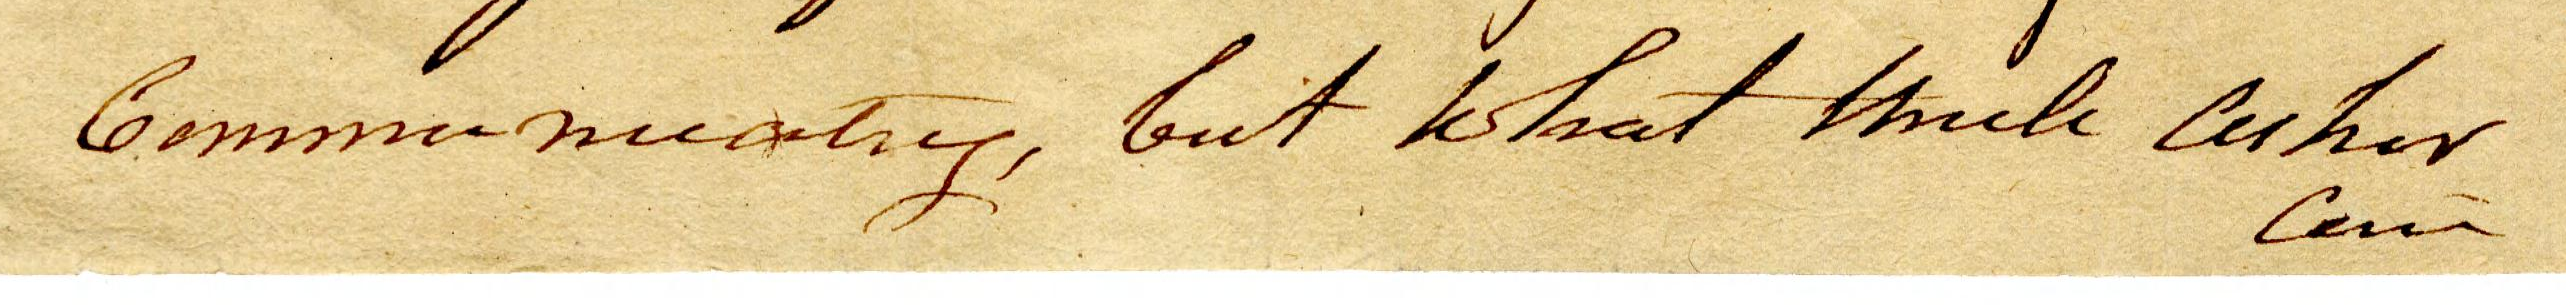Communicating, but what Uncle Cerher
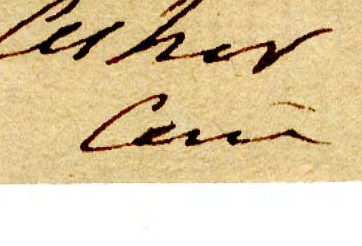Can
